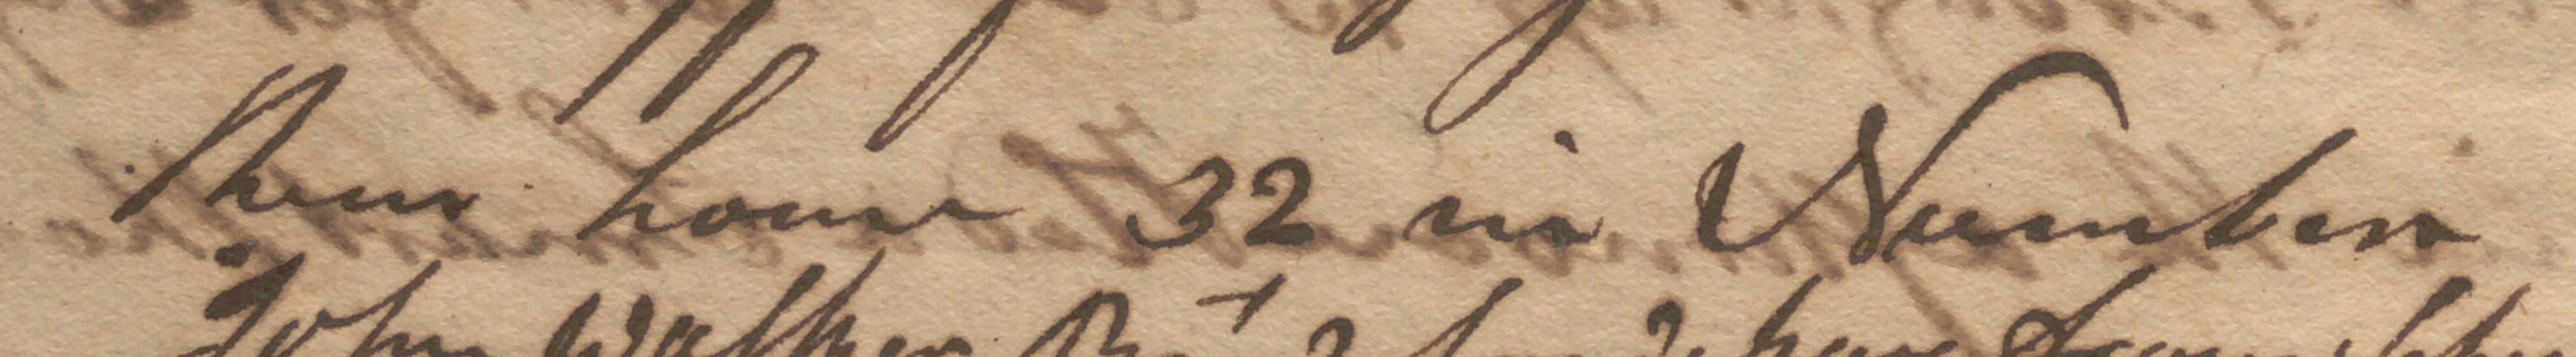them home 32 in Number
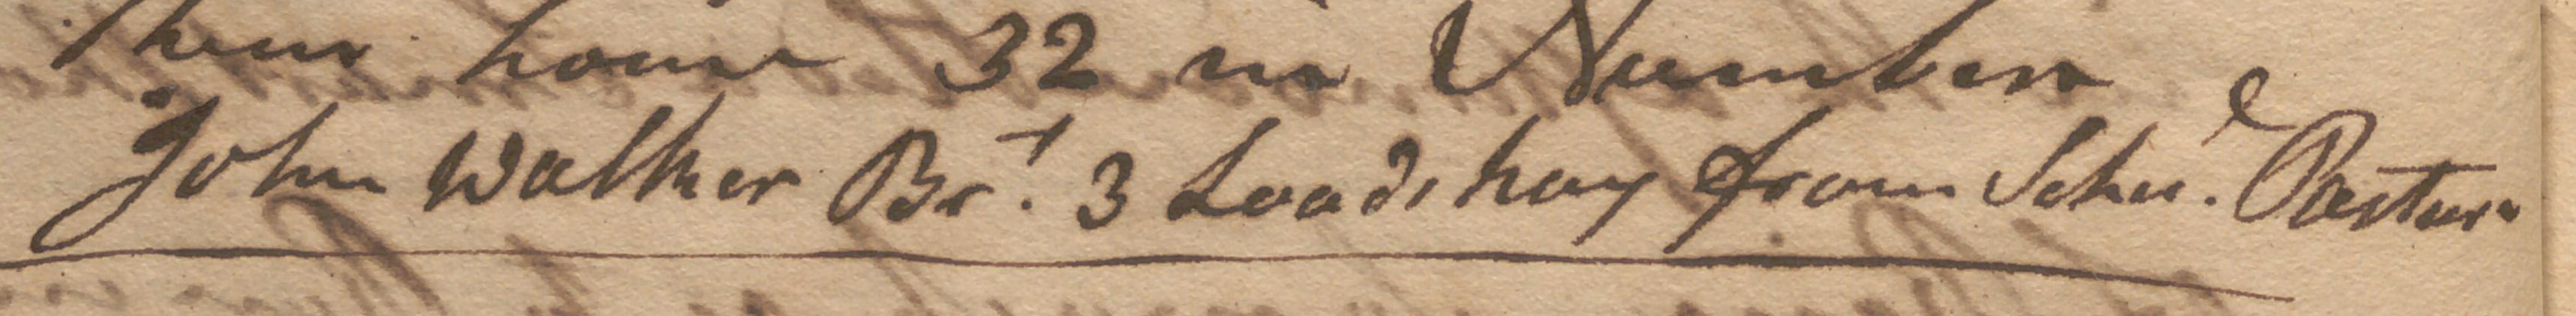John Walker Br^t. 3 Loads hay foon Schu^l. Pasture
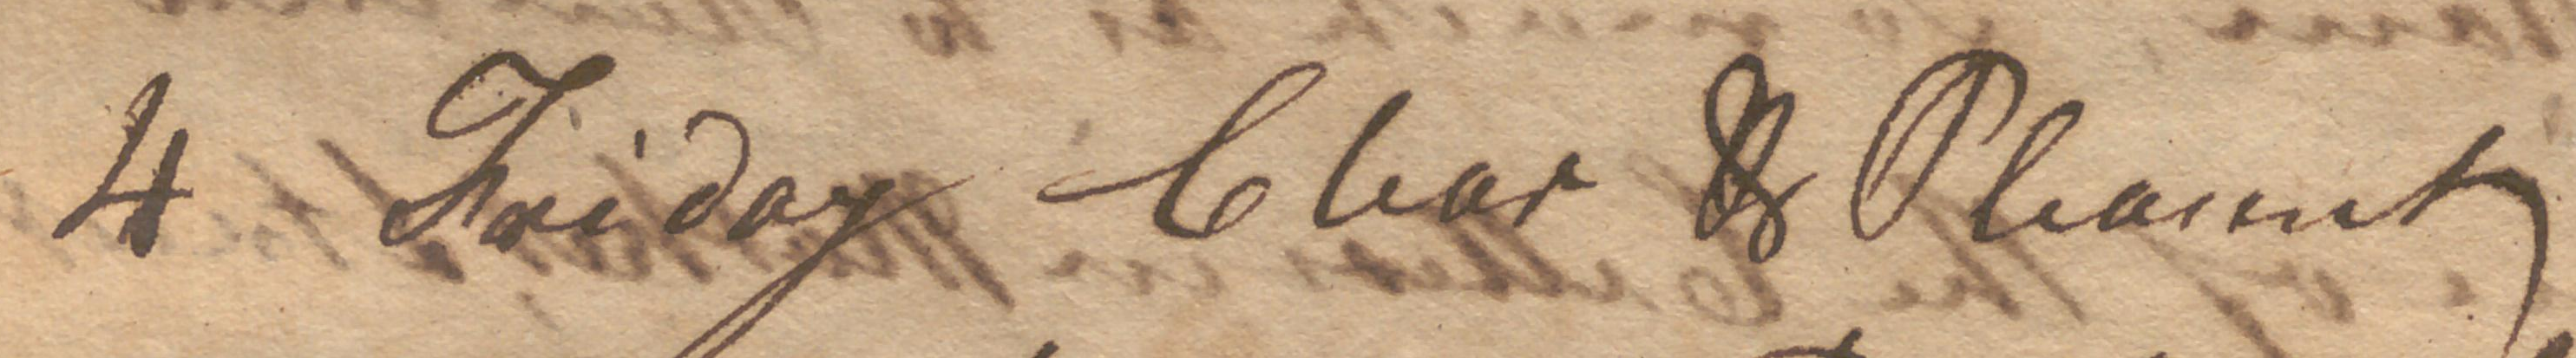4 Friday Clear & Pleasent
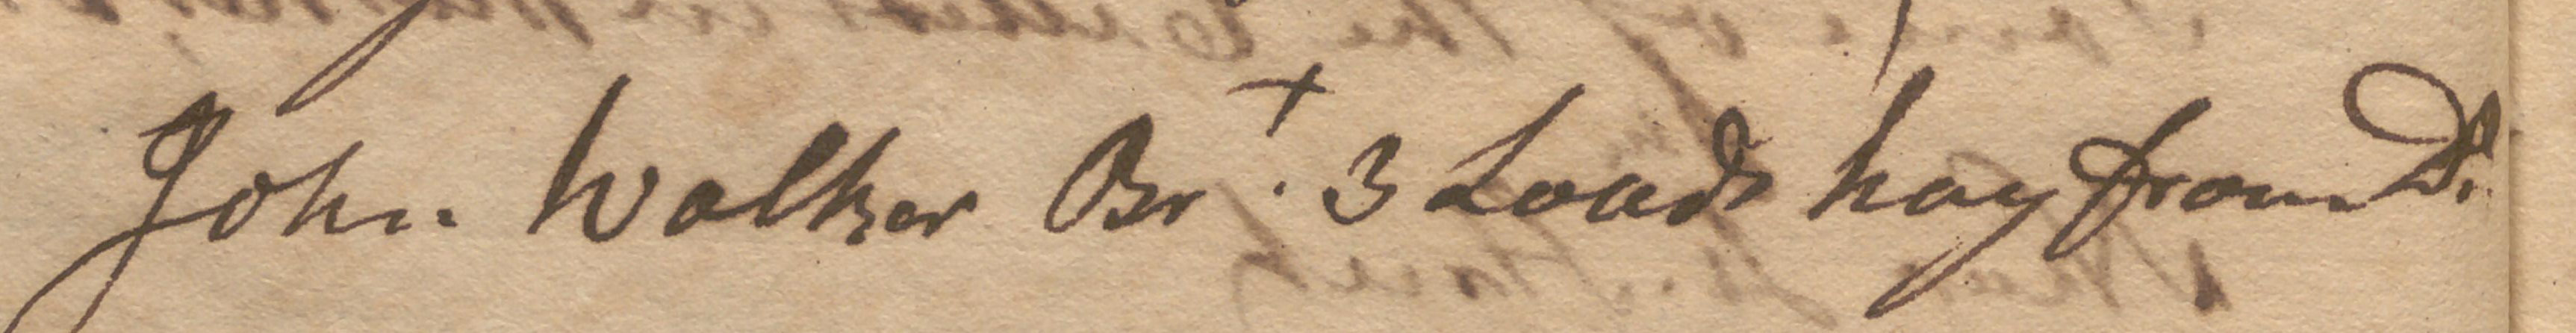John Walker Br^r. 3 Loads hay from D^o.
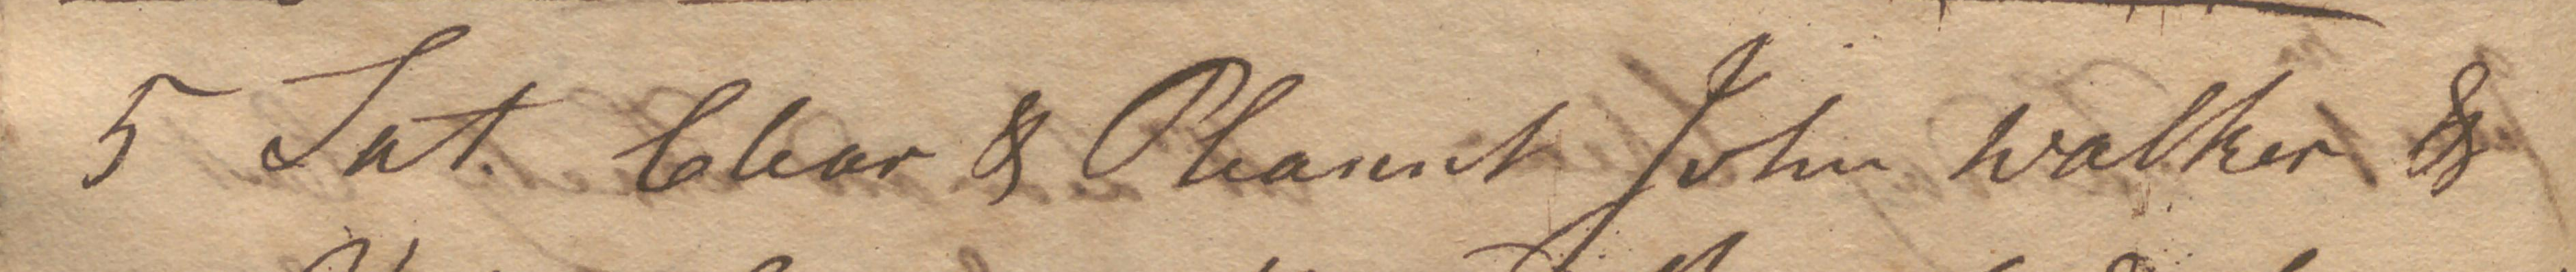5 Sat. Clear & Pleasent John walker &
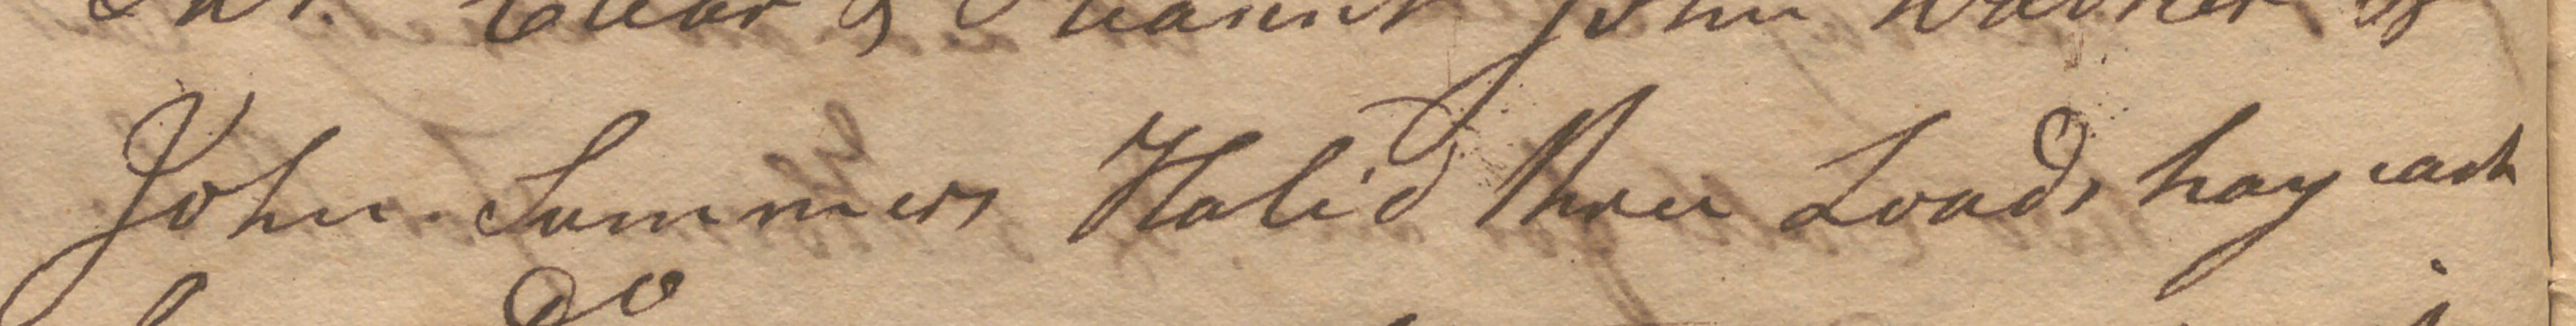Johe Summers Hale'd theree Loads hay cart
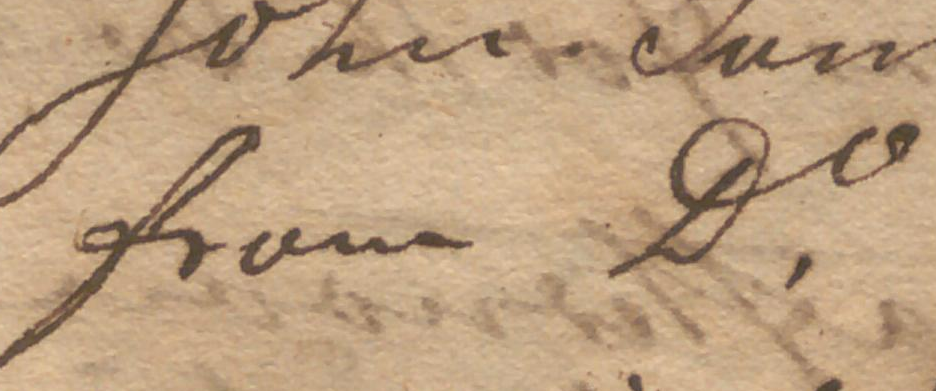from D^o.
